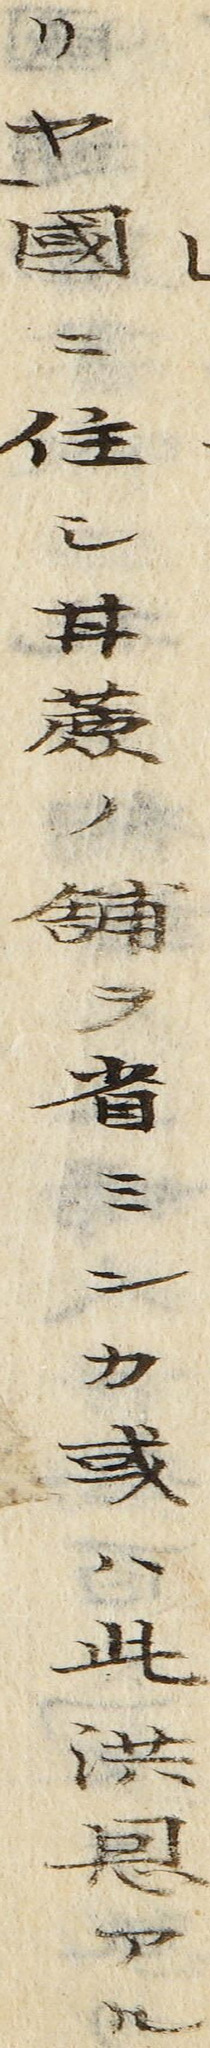リヤ」国ニ住シ甘蔗ノ舗ヲ省ミンカ或ハ此洪恩アル
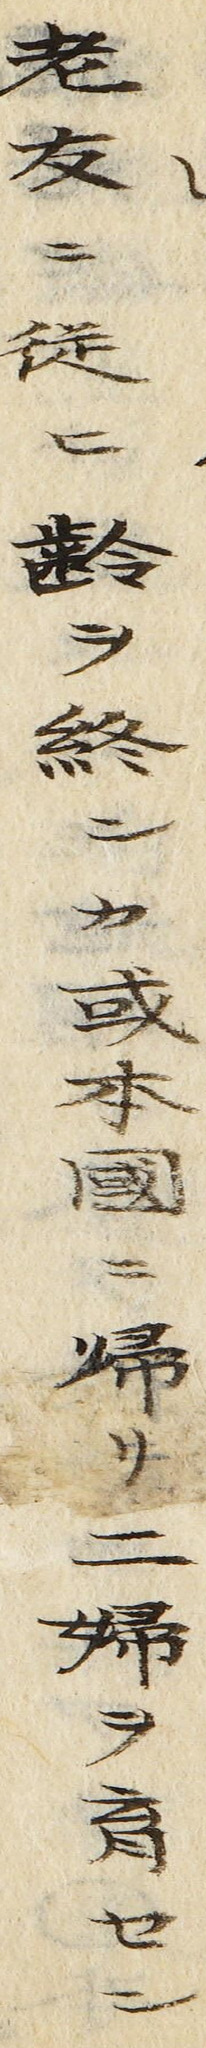老友ニ従ヒ齢ヲ終ンカ或本国ニ帰リ二婦ヲ育セン
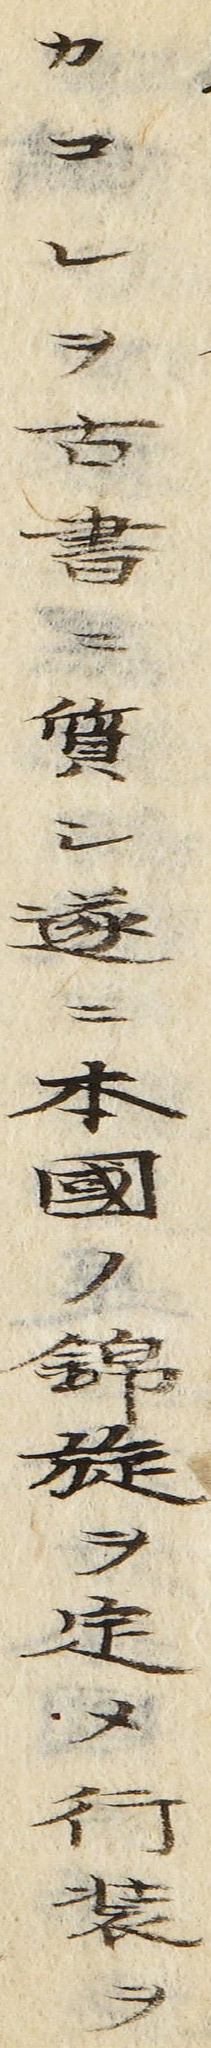カコレヲ古書ニ質シ遂ニ本国ノ錦旋ヲ定メ行装ヲ
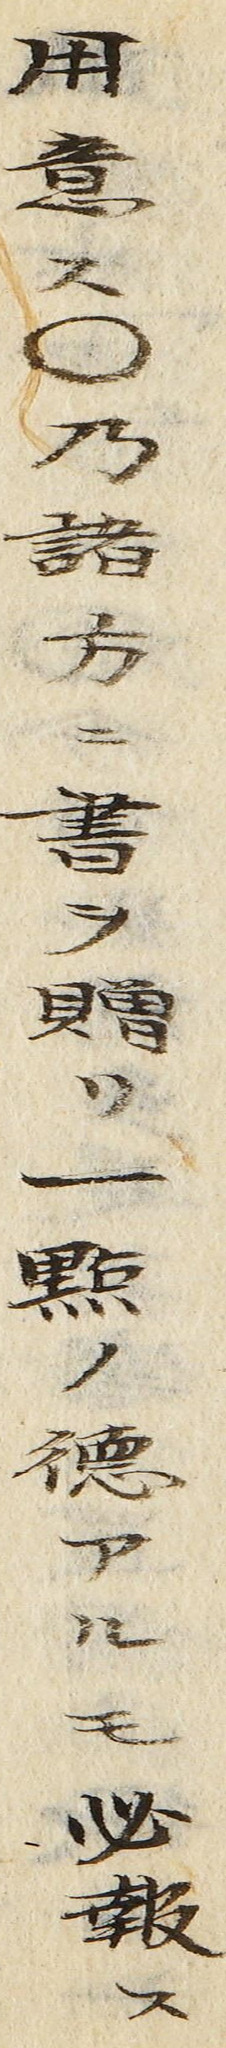用意ス◯乃諸方ニ書ヲ贈リ一点ノ徳アルモ必報ス
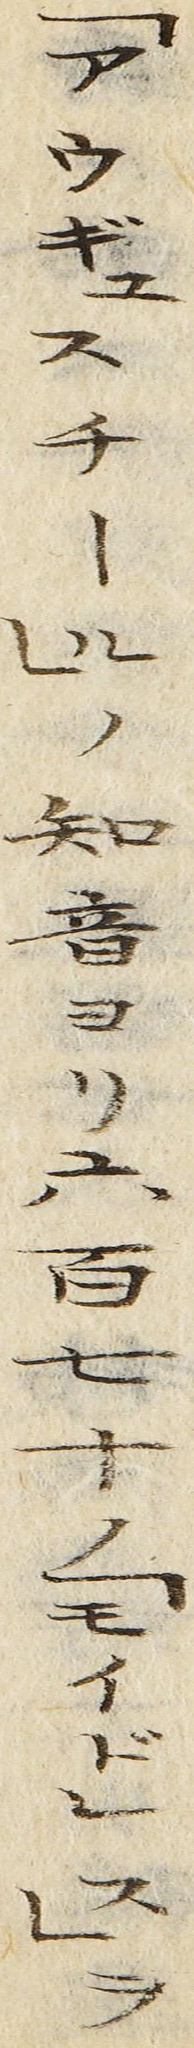「アウギュスチール」ノ知音ヨリ六百七十ノ「モイドレス」ヲ
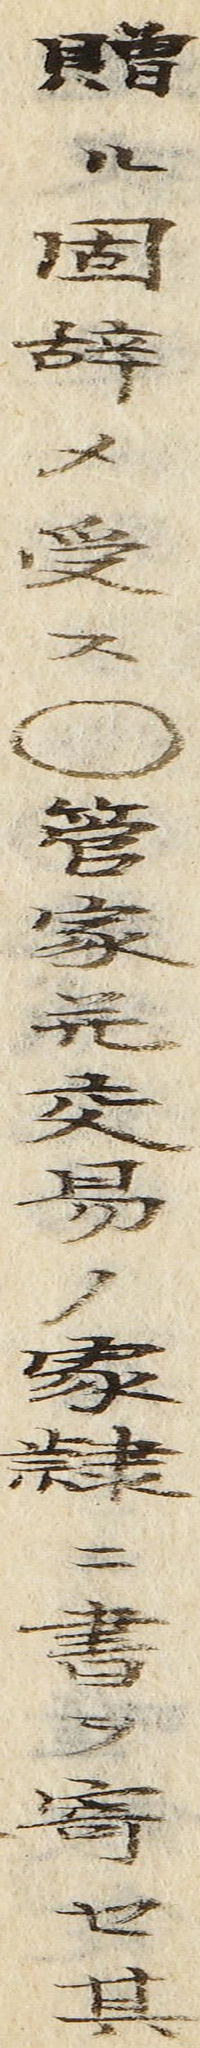贈ル固辞シテ受ス◯管家并交易ノ家隷ニ書ヲ寄セ其
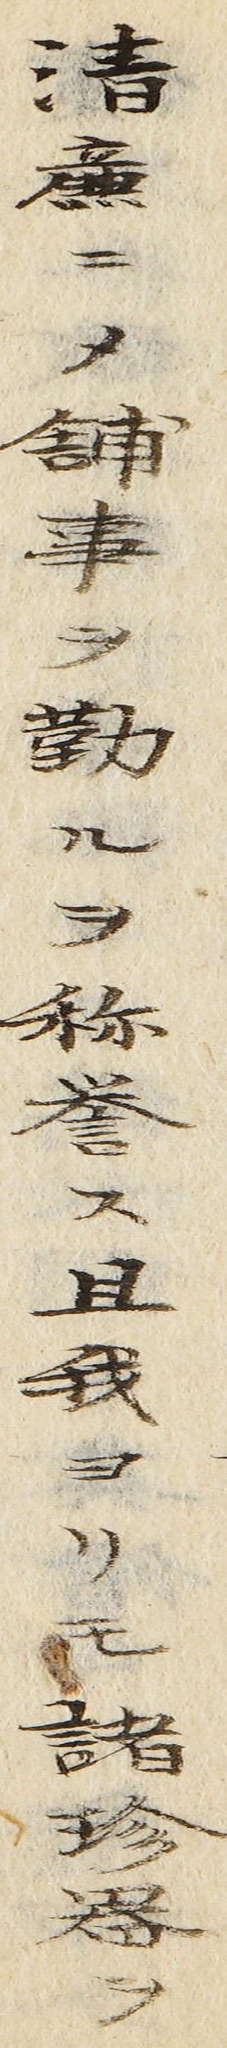清廉ニシテ舗事ヲ勤ルヲ称誉ス且我ヨリモ諸珍器ヲ
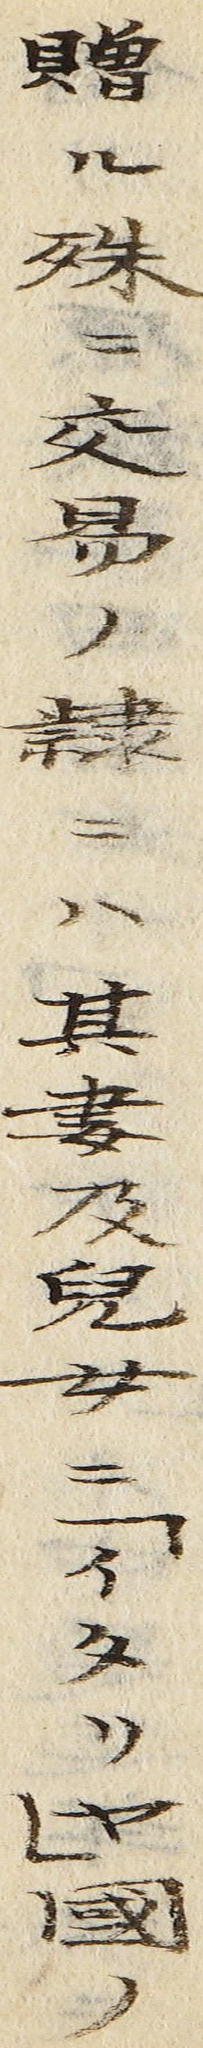贈ル殊ニ交易ノ隷ニハ其妻及児女ニ「イタリヤ」国ノ
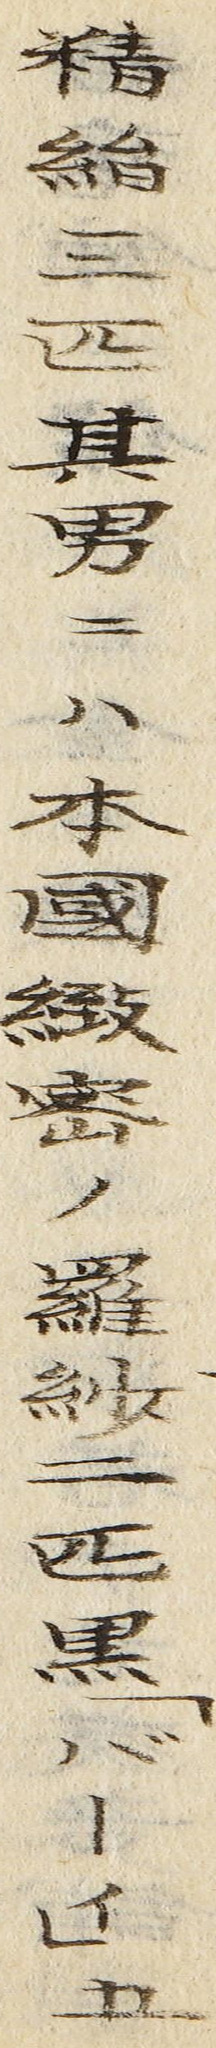精絹三匹其男ニハ本国緻密ノ羅紗二匹黒「バーイ」五
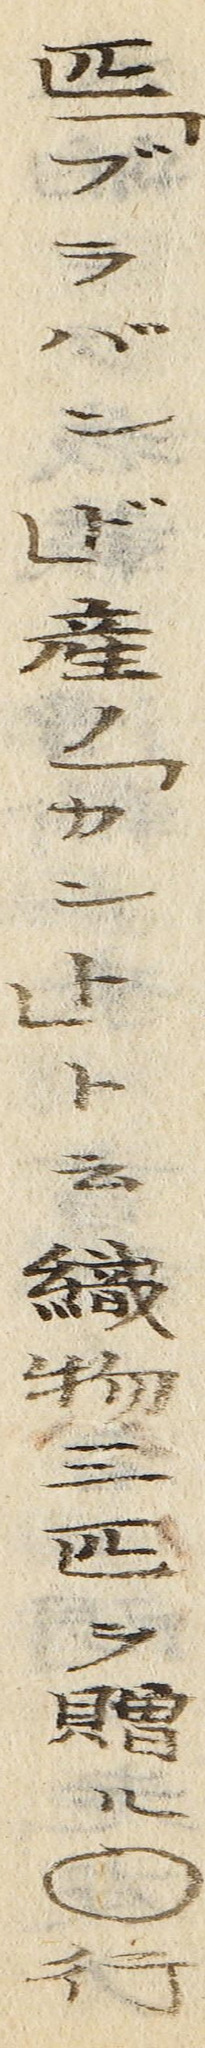匹「ブラバンド」産ノ「カント」ト云織物三匹ヲ贈ル◯行
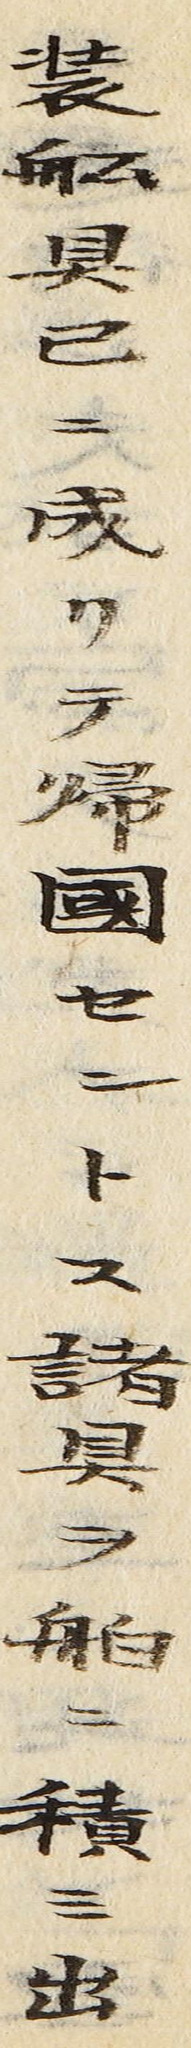装船具已ニ成リテ帰国セントス諸具ヲ舶ニ積ミ出
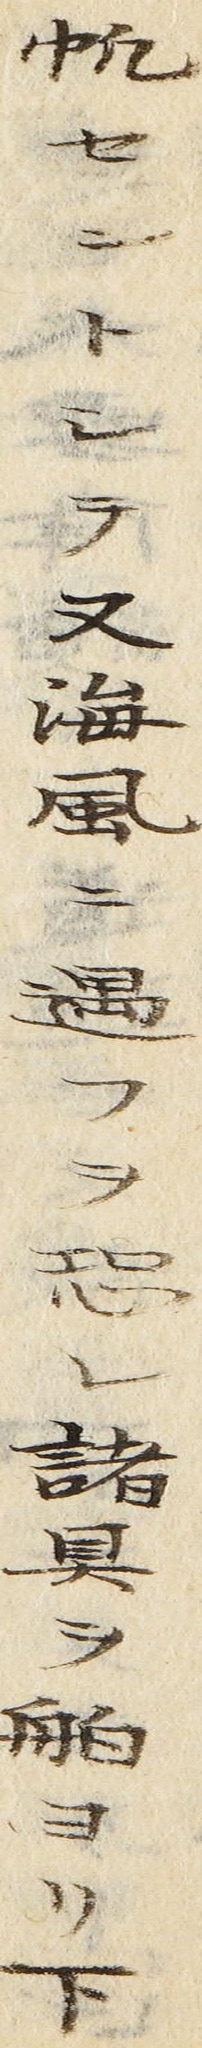帆セントシテ又海風ニ遇フヲ恐レ諸具ヲ舶ヨリ下
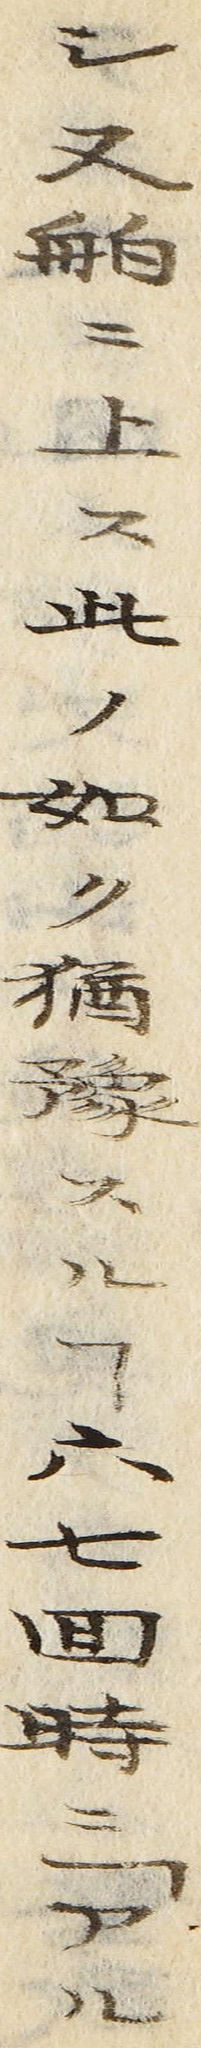シ又舶ニ上ス此ノ如ク猶予スルコト六七回時ニ「アル
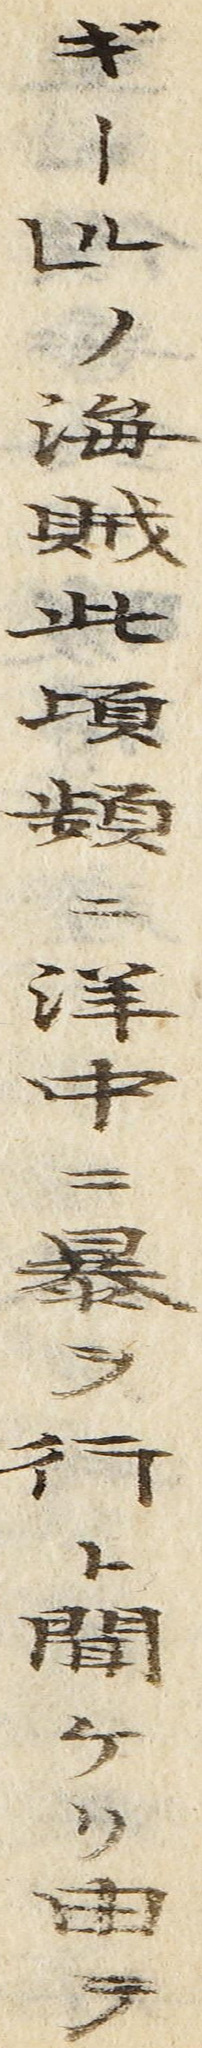ギール」ノ海賊此頃頻ニ洋中ニ暴ヲ行ト聞ケリ由テ
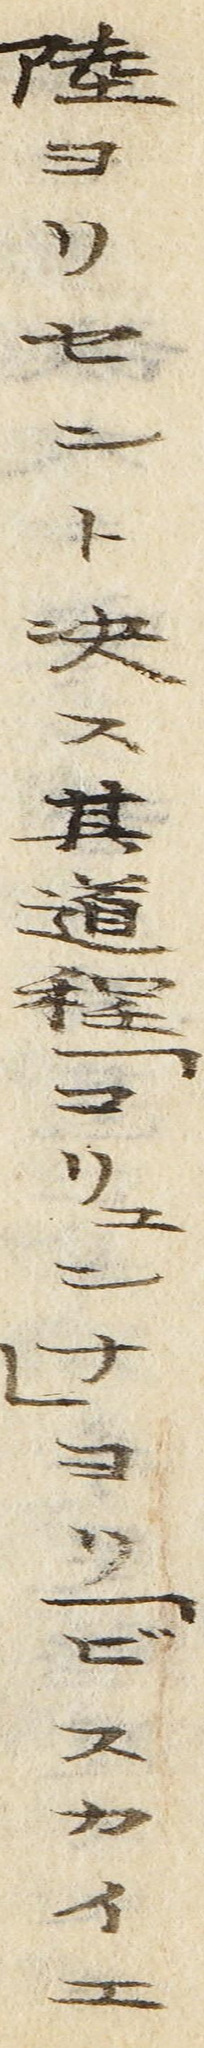陸ヨリセント決ス其道程「コリュンナ」ヨリ「ビスカイエ
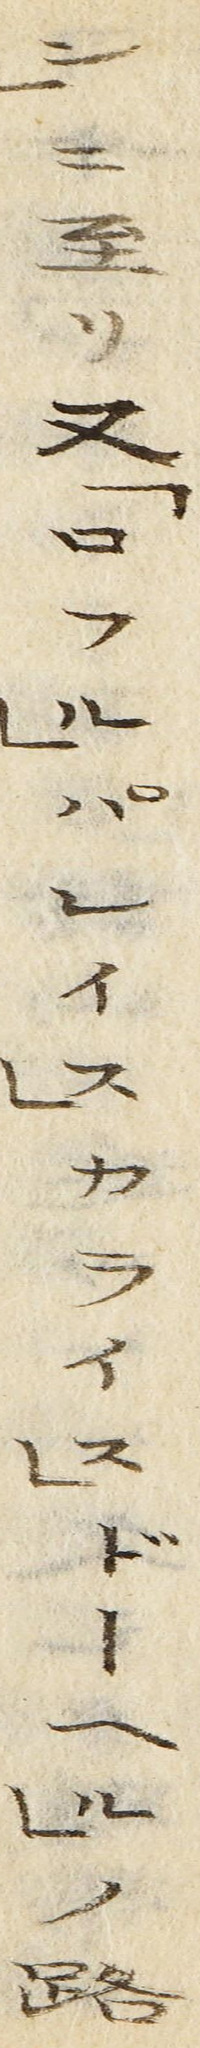ン」ニ至リ又「ロフル」パレイス」カライス」ドーヘル」ノ路
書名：漂流紀事
